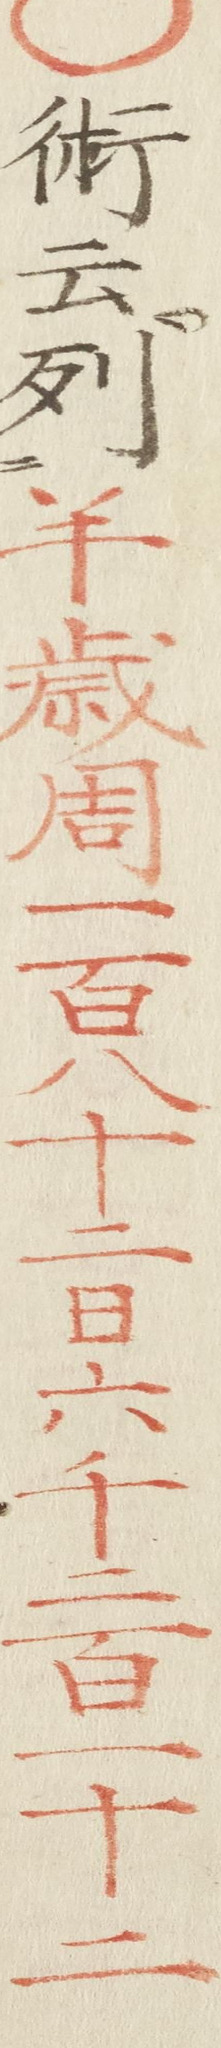○術云。列半歳周一百八十二日六千二百一十二
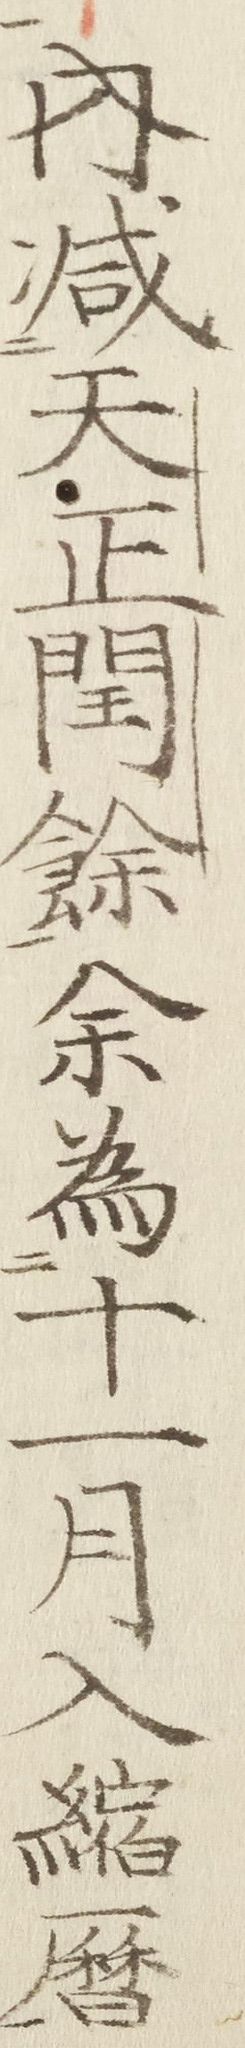分半内減天正閏餘余為十一月入縮暦
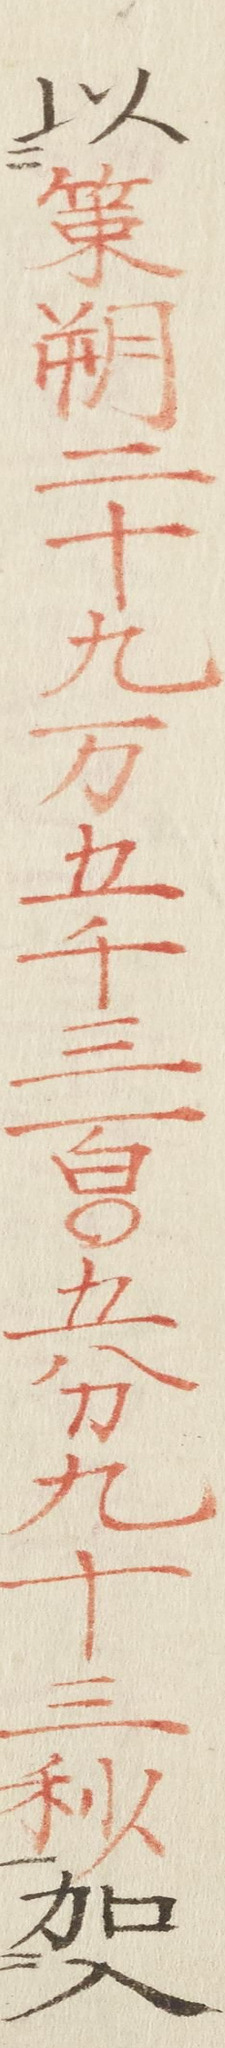以策朔二十九万五千三百〇五分九十三秒加入
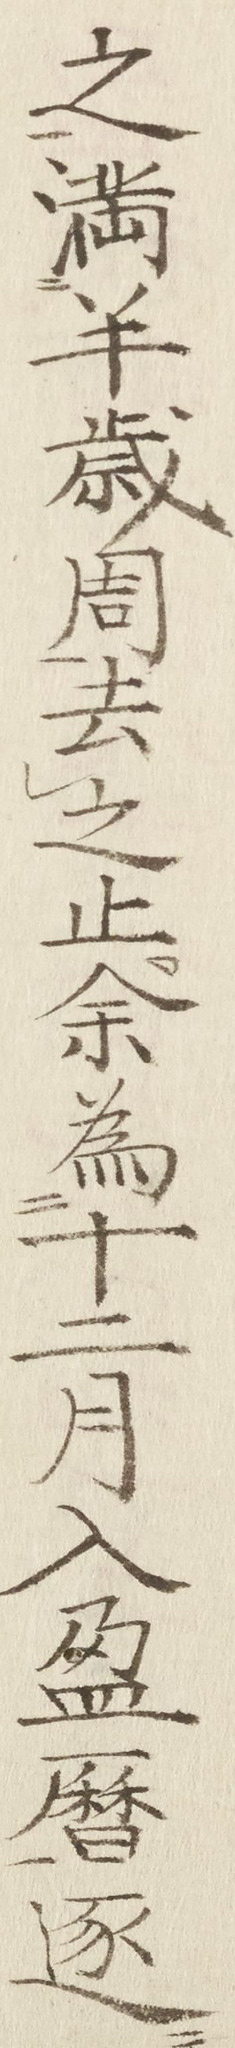之満半歳周去之止。余為十二月入盈暦逐
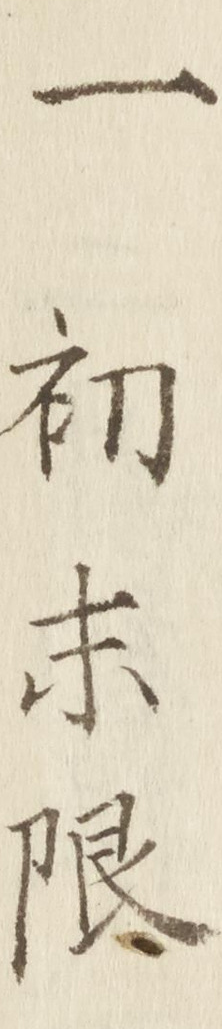一初末限

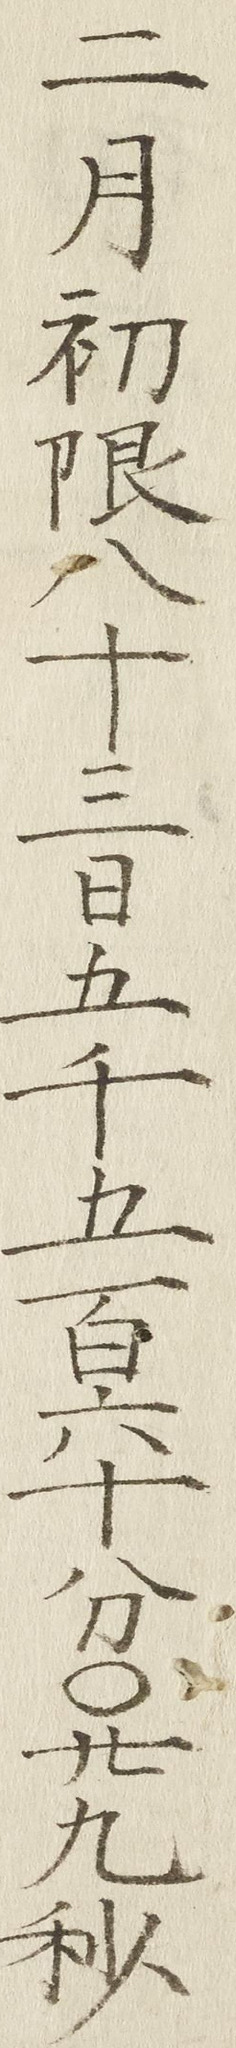二月初限八十三日五千五百六十分〇廿九秒
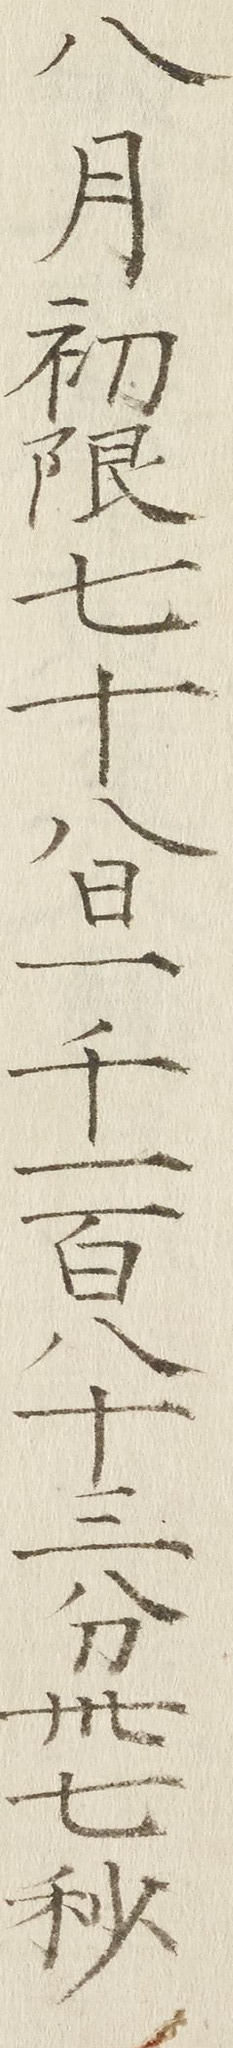八月初限七十八日一千一百八十三分卅七秒
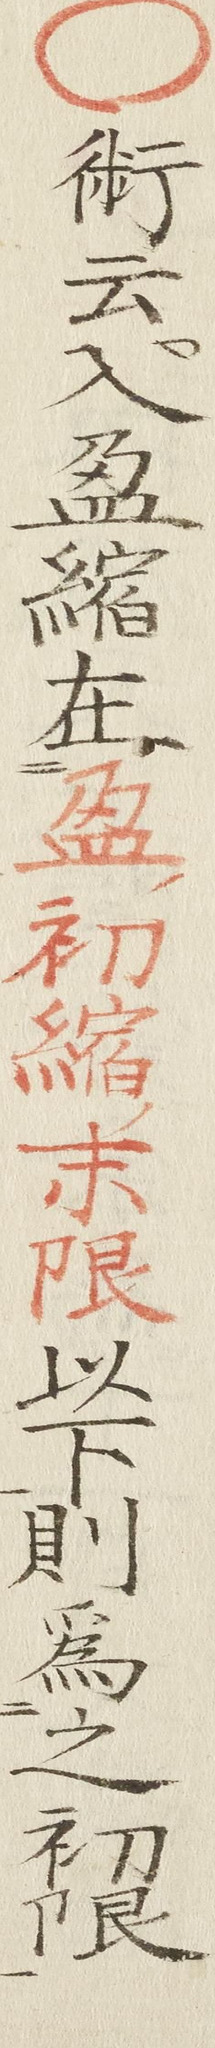○術云。入盈縮在盈初縮末限以下則為之初限
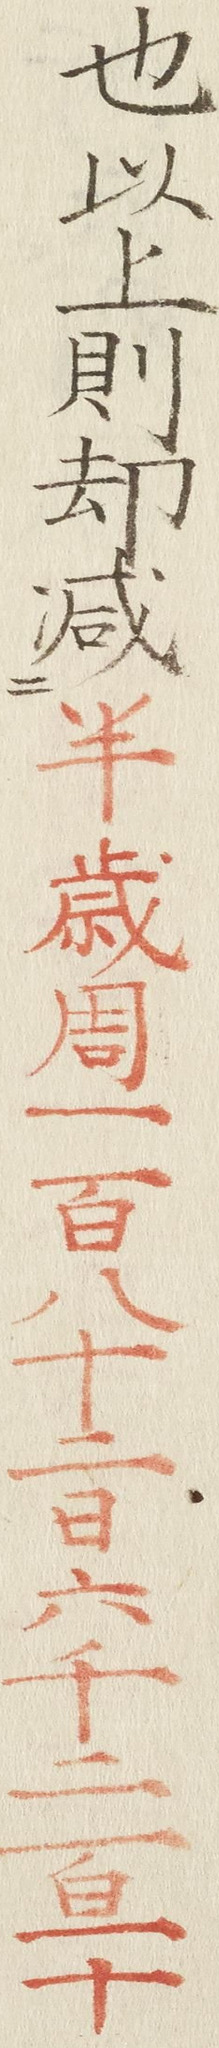也以上則却減半歳周一百八十二日六千二百一十
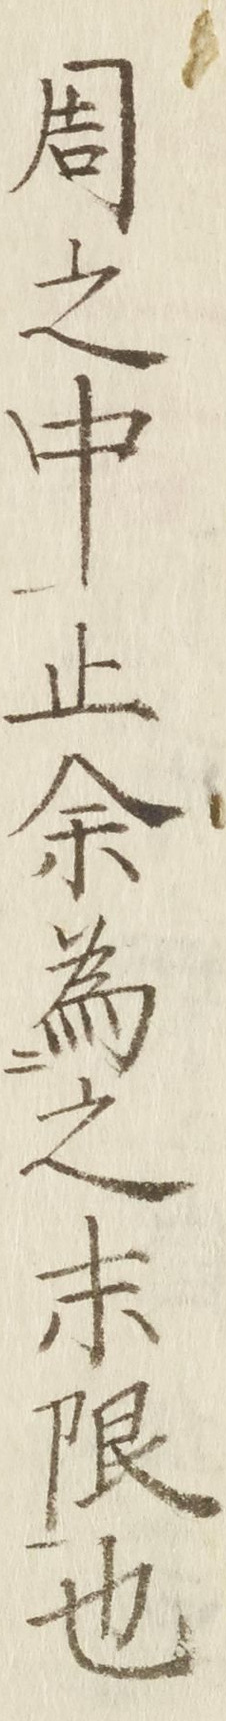周之中止余為之末限也
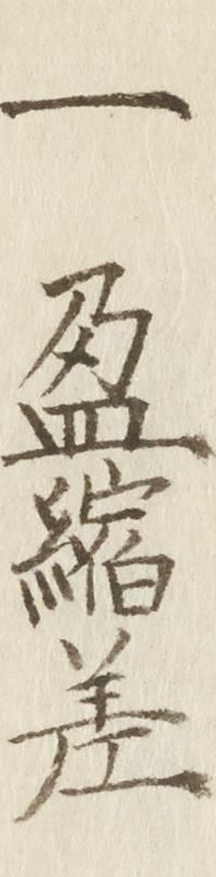一盈縮差
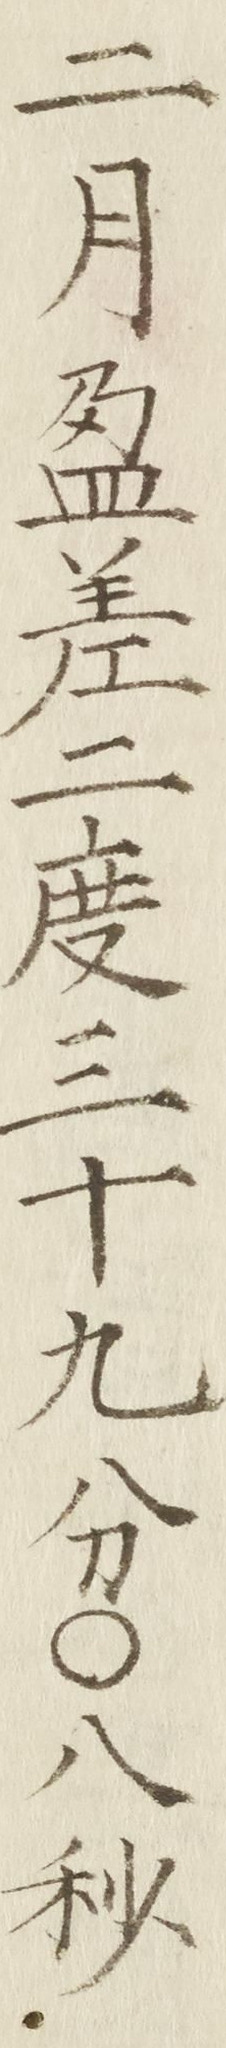二月盈差二度三十九分〇八秒
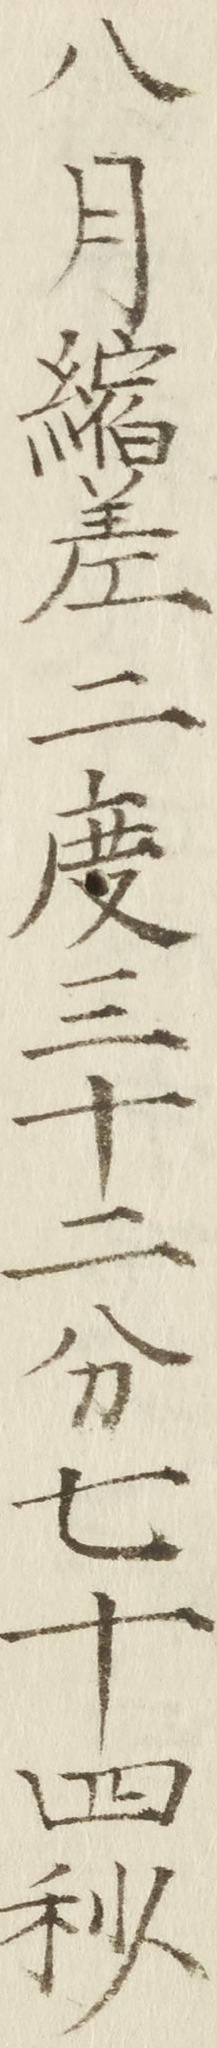八月縮差二度三十二分七十四秒
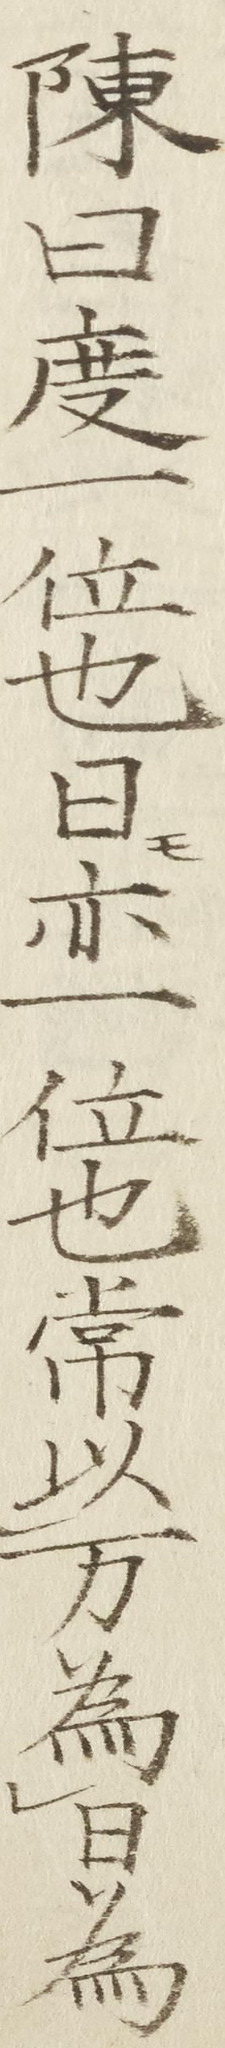陳曰度一位也日亦一位也常以万為日為
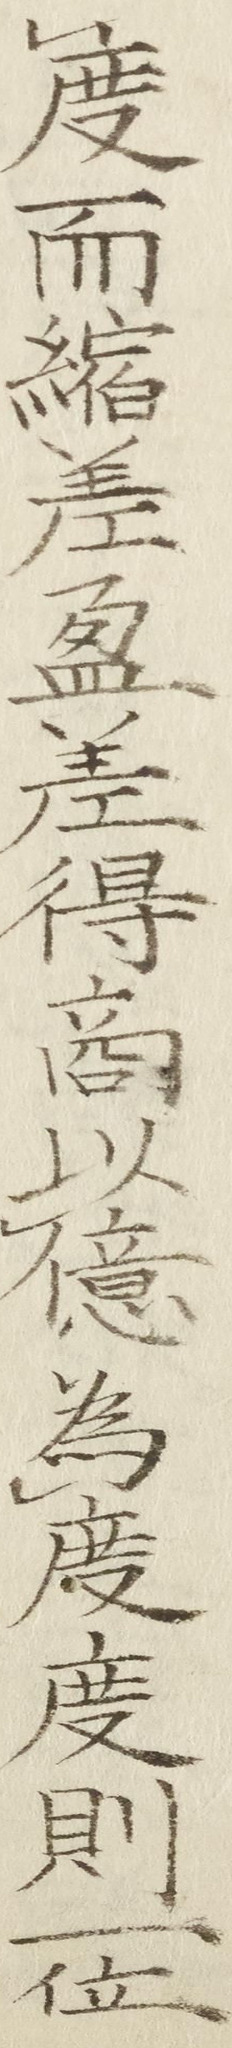度而縮差盈差得商以億為度度則一位
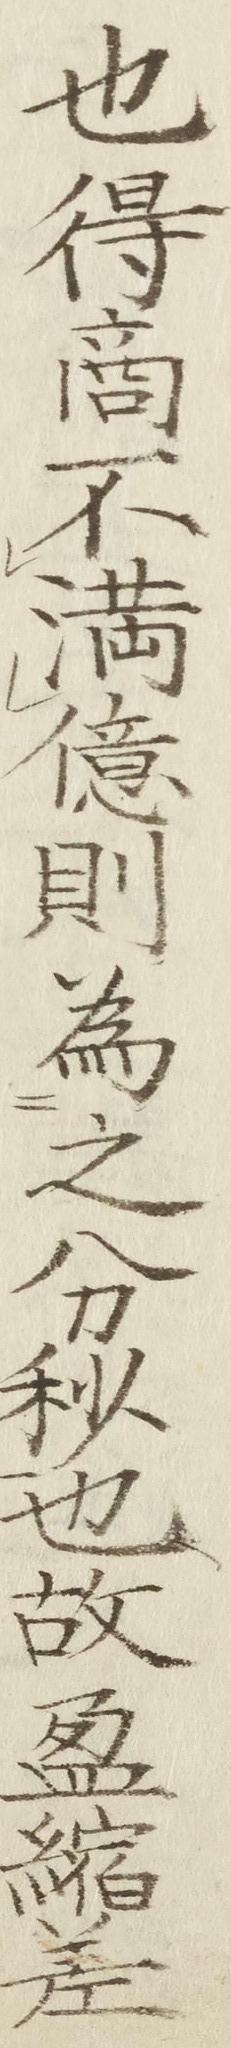也得商不満億則為之分秘也故盈縮差
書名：日食度
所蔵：東京大学地震研究所図書室 Earthquake Research Institute Library, The University of Tokyo, JAPAN
